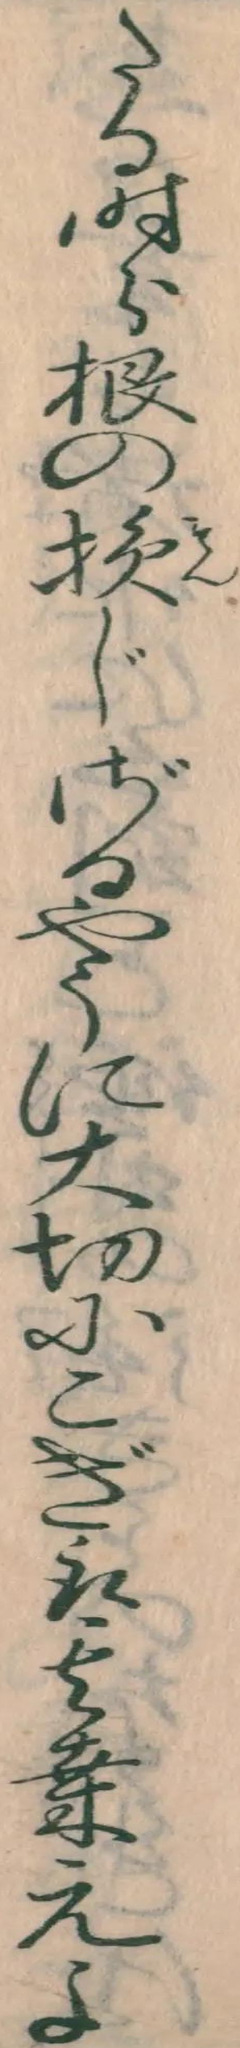たる時分根の損じざるやうに大切にこぎ取其桑元よ
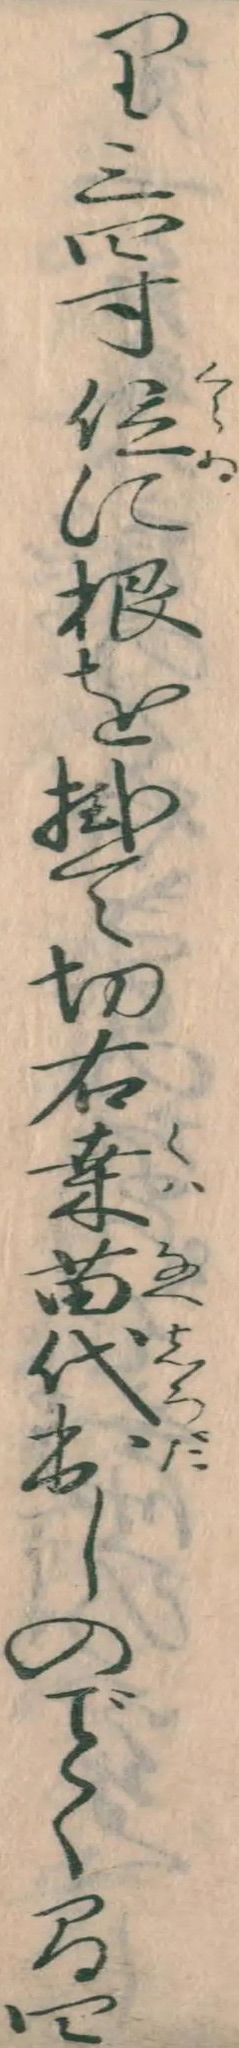り三四寸位に根を掛て切右桑苗代出しのごとく間四
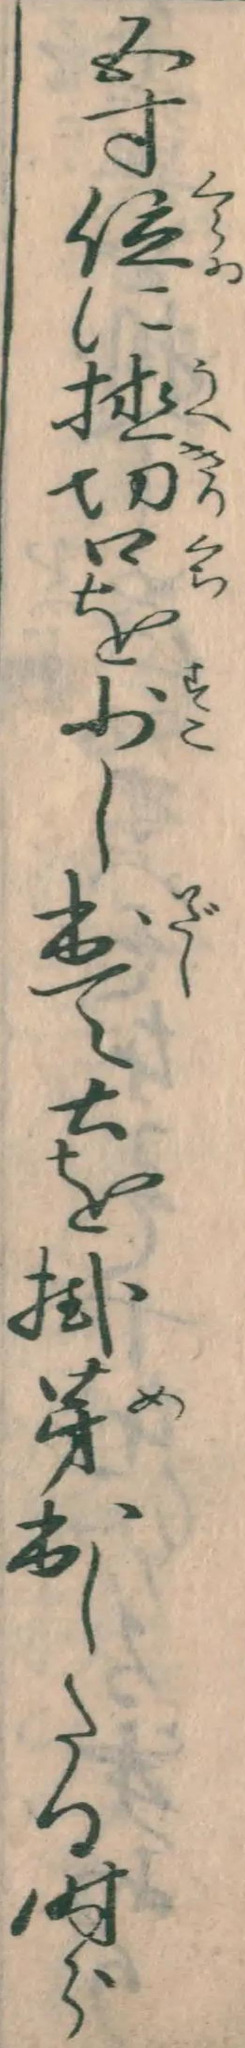五寸位に植切口を少し出て土を掛芽出したる時分

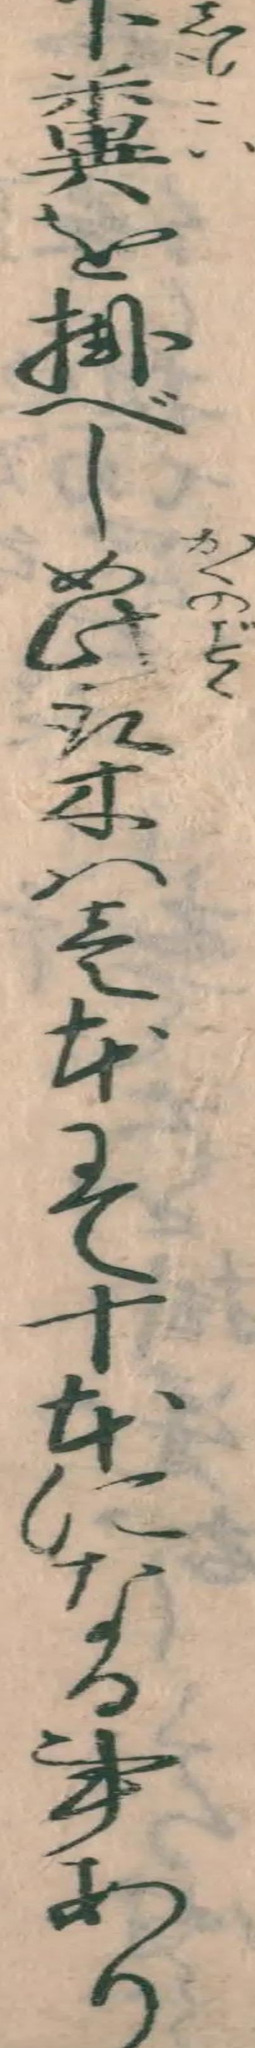下糞を掛べし如此取木は壱本にて十本になる事あり
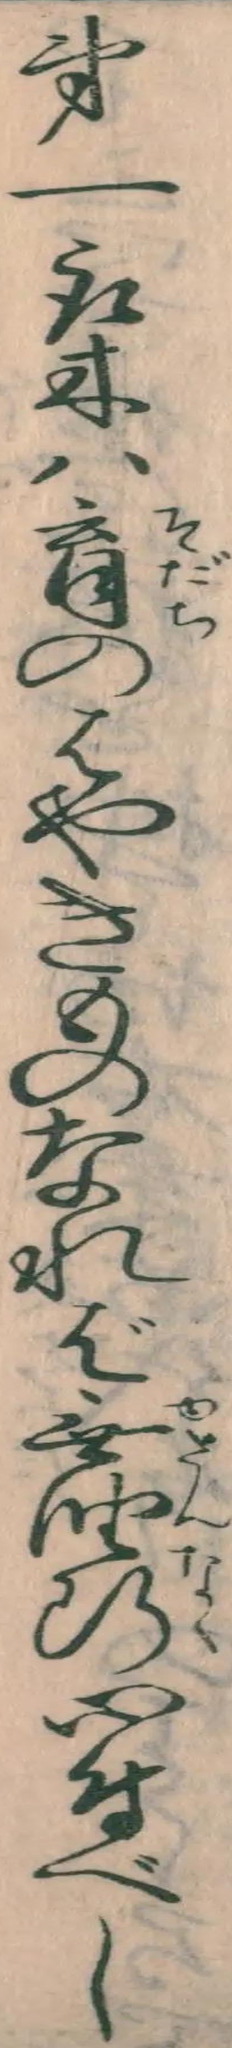第一取木は育のはやきものなれば無油断心付べし
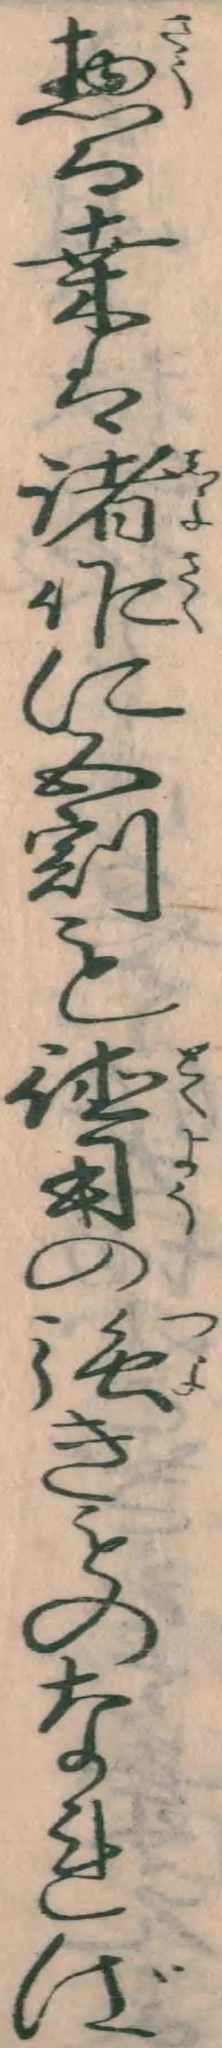惣而桑は諸作に五割も徳用の強きものなれば
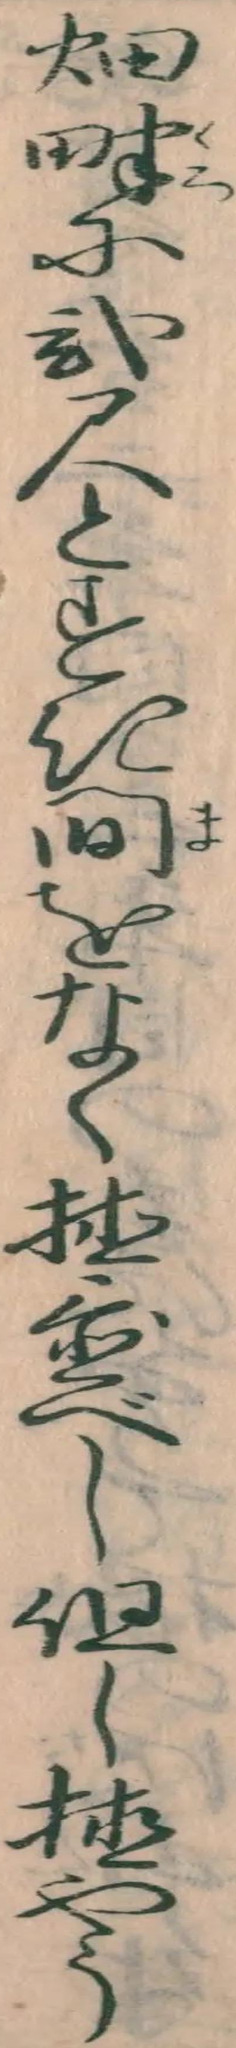畑畔に弐尺とすき間をなく植置べし但し植やう
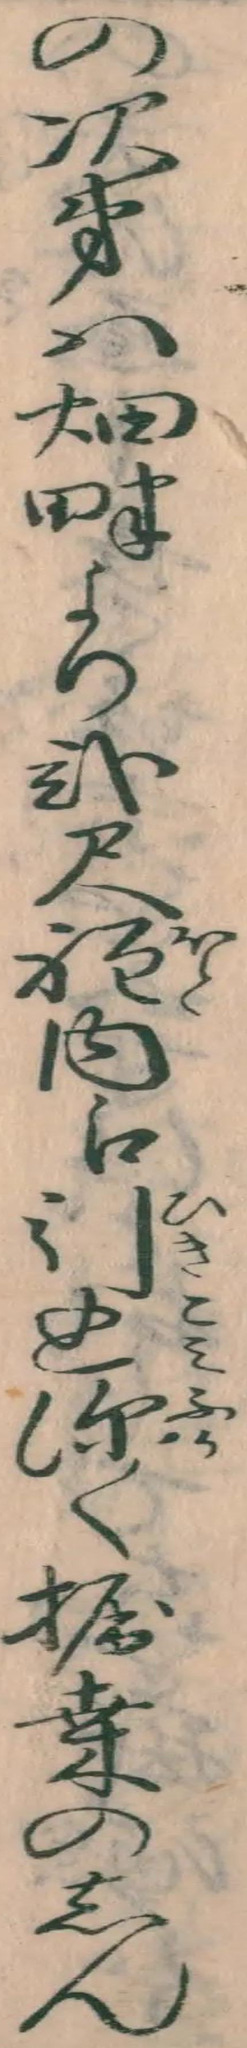の次第は畑畔より弐尺程内え引込深く掘桑のしん
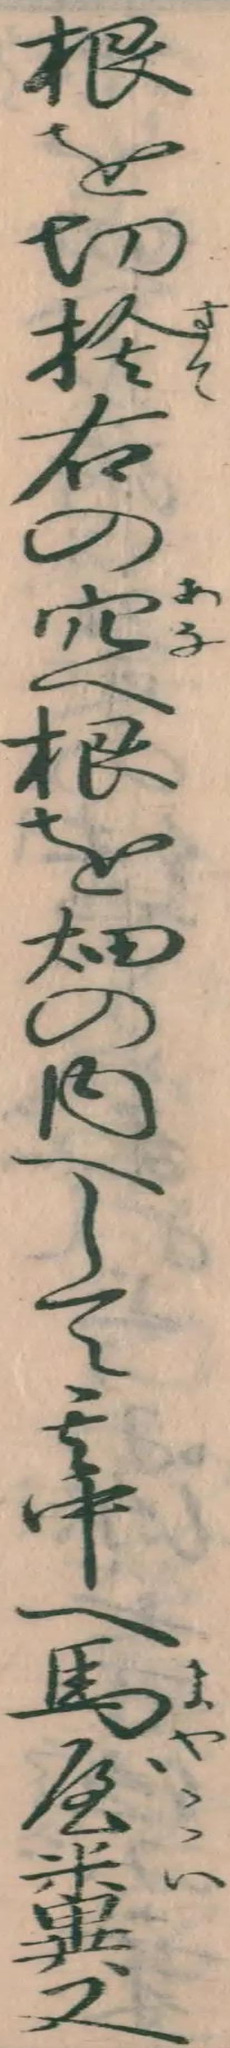根を切捨右の穴へ根を畑の内へして其中へ馬屋糞又
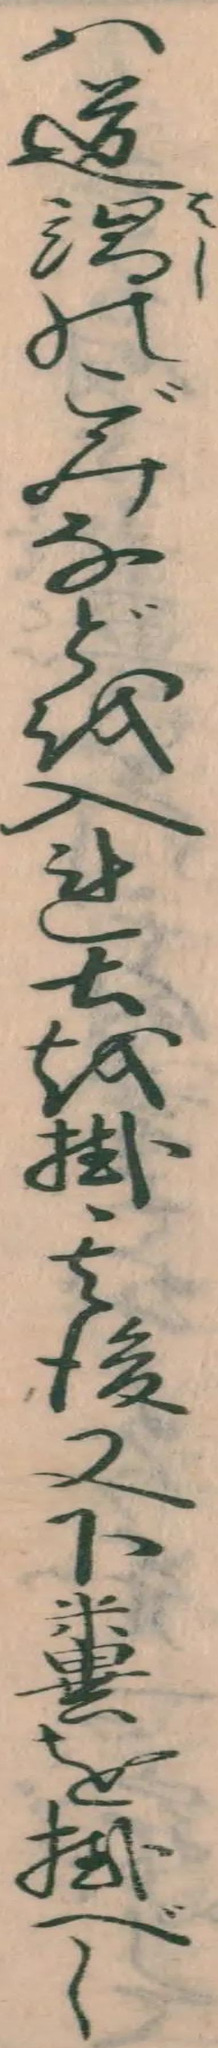は道端のごみなどを入れ土を掛其後又下糞を掛べし
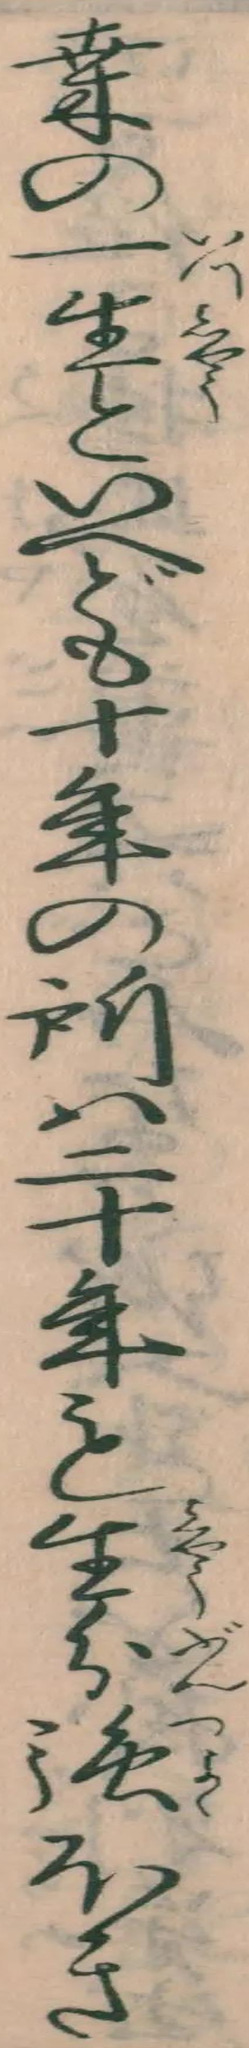桑の一生といへども十年の所は二十年も生分強ほき
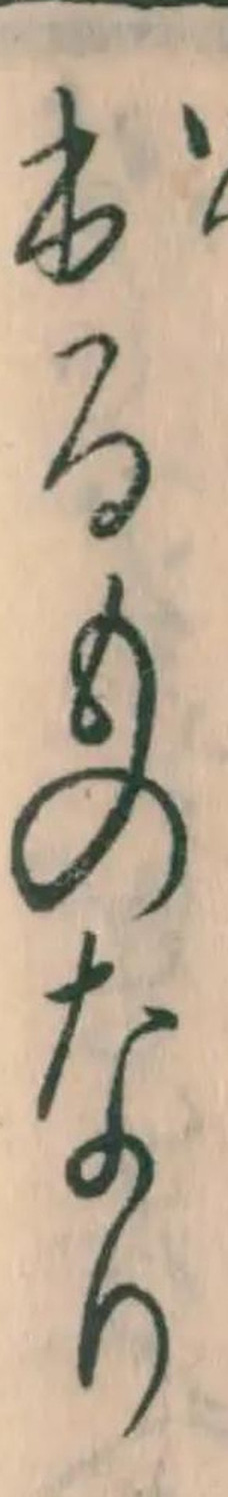出るものなり
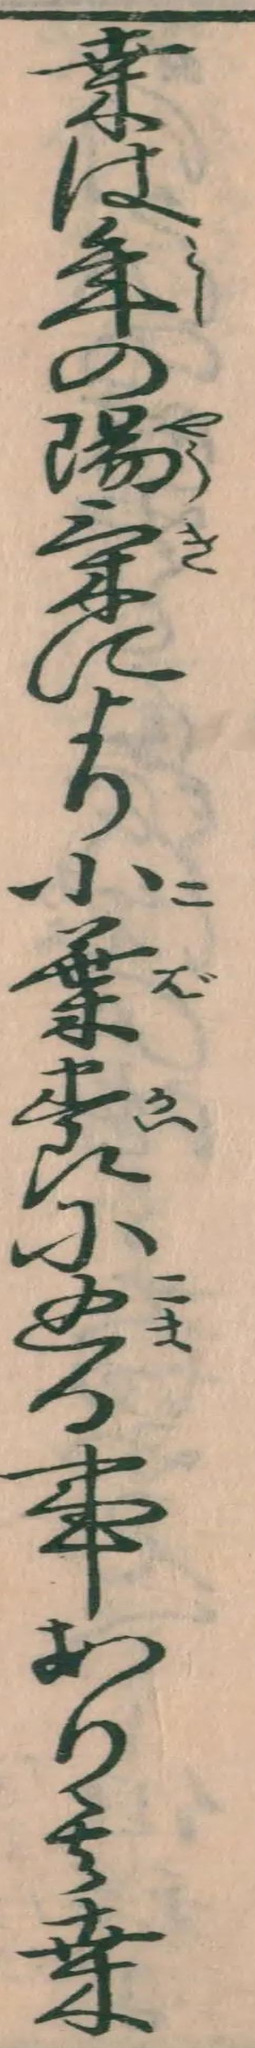桑は年の陽気により小葉養に込る事あり其桑
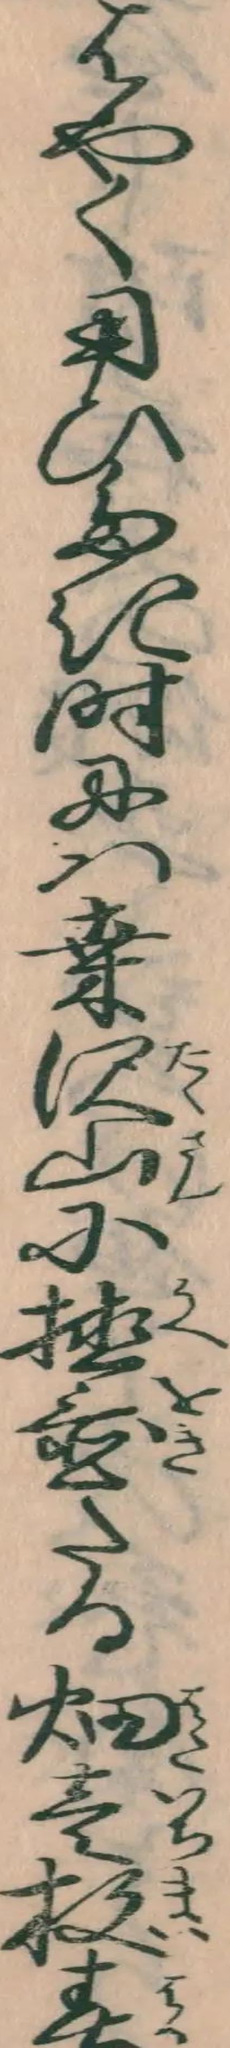はやく用ひたき時には桑沢山に植置たる畑壱枚春
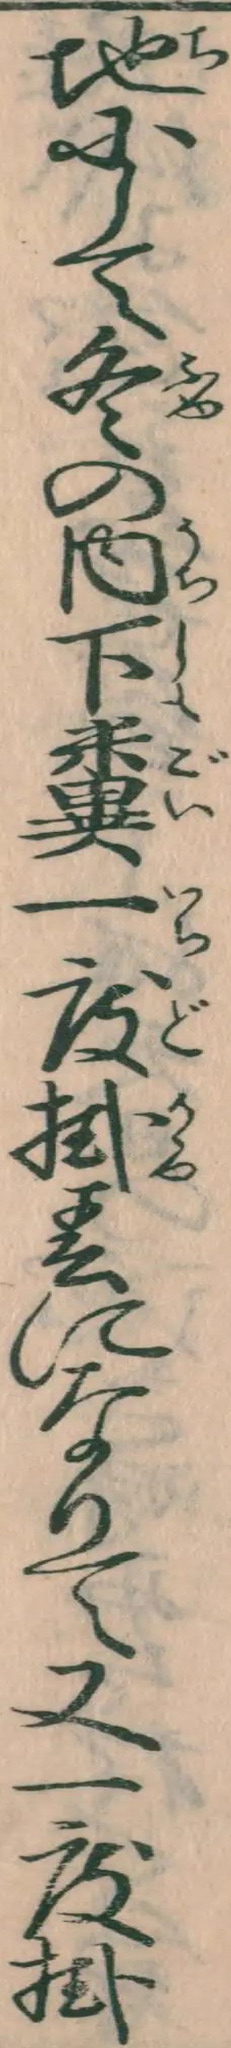地にして冬の内下糞一度掛春になりて又一度掛
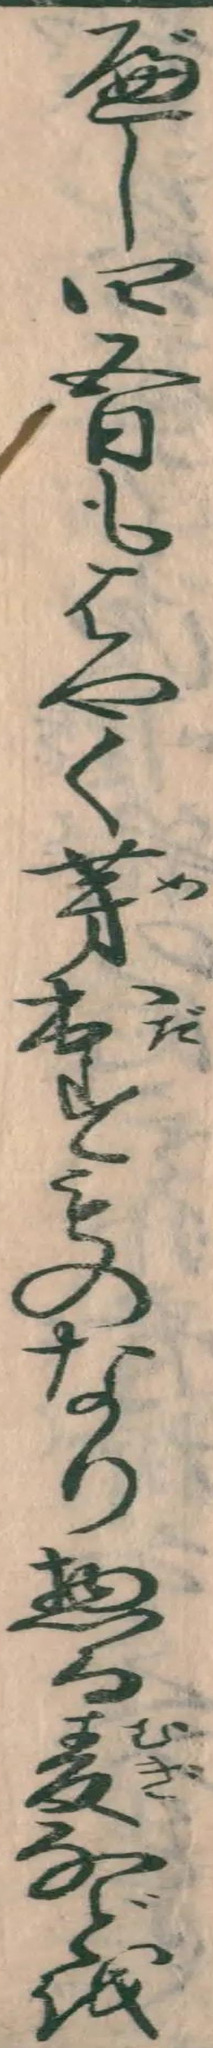べし四五日もはやく芽出すものなり惣而麦などを
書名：新撰養蚕秘書
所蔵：国立国会図書館 National Diet Library, JAPAN
